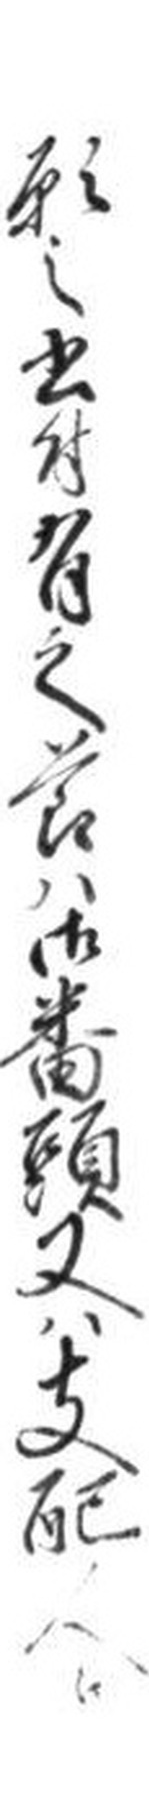願之書付有之節は御番頭又は支配人え
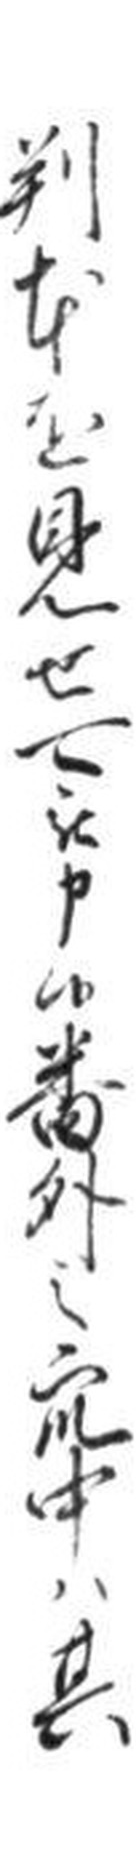判本を見せ可被申候番外之衆中は其
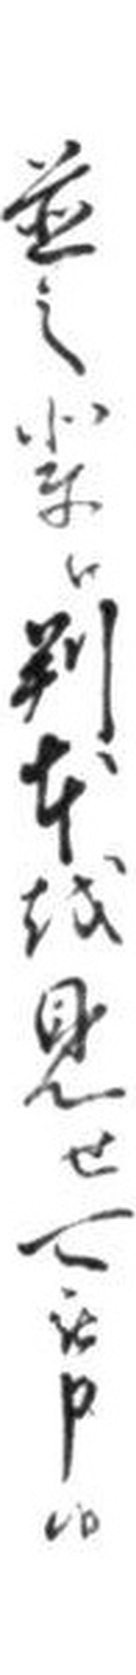並之輩え判本を見せ可被申候
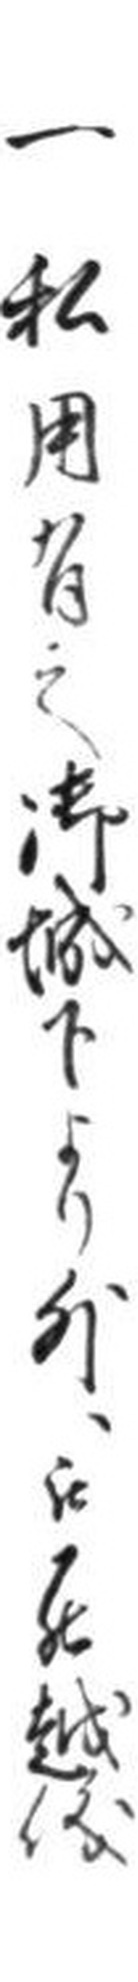一私用有之御城下より外へ被罷越儀
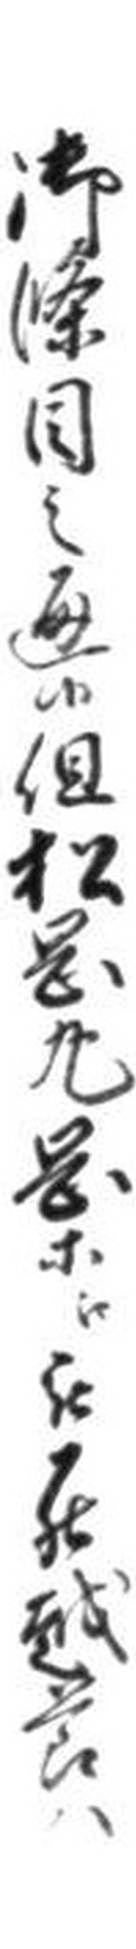御条目之通候但松岡丸岡等え被罷越節は
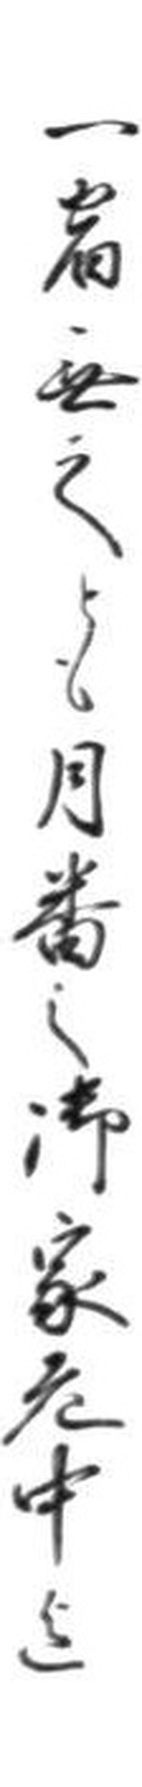一宿無之とも月番之御家老中迄
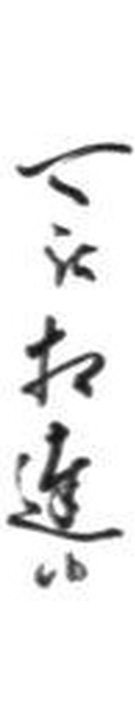可被相達候
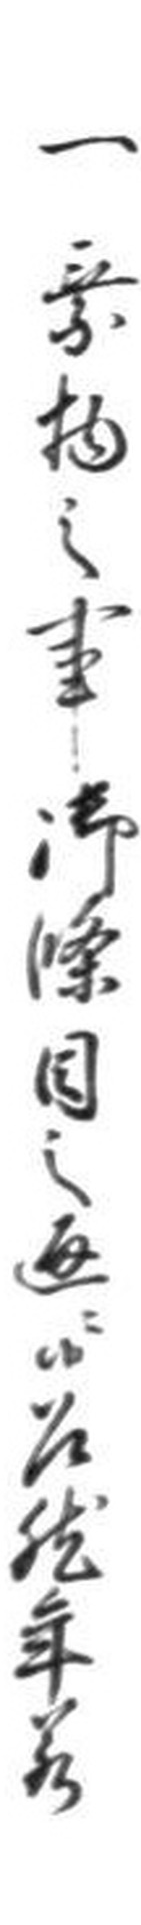一乗物之事御条目之通に候乍然年若
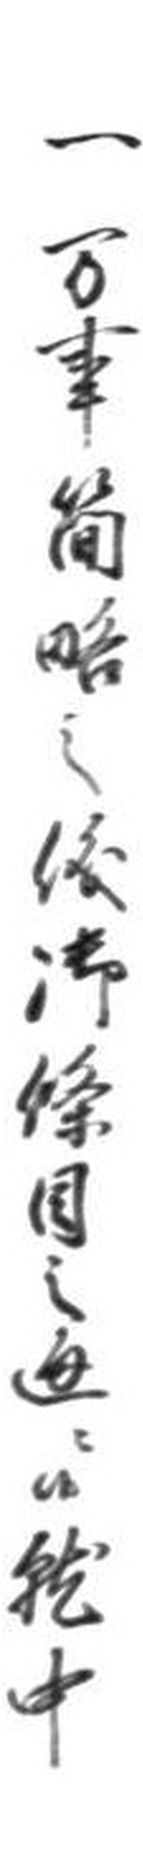一万事簡略之儀御条目之通に候就中
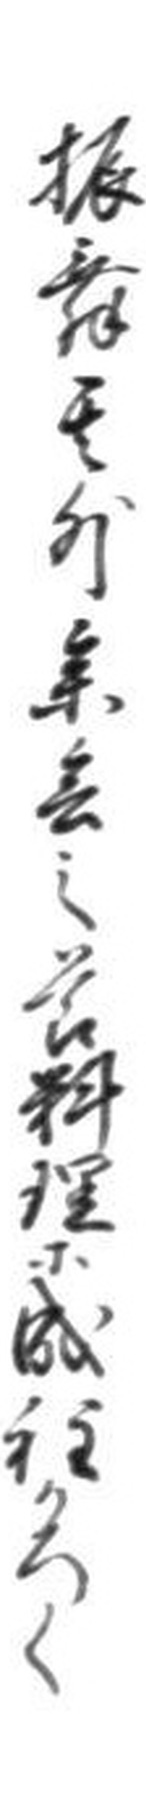振舞其外参会之節料理等成程かろく
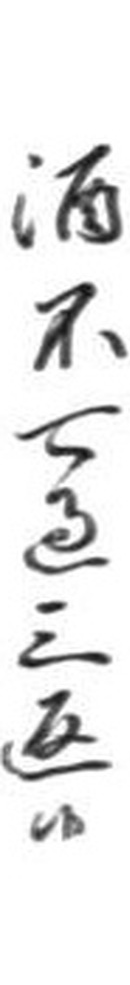酒不可過三返候
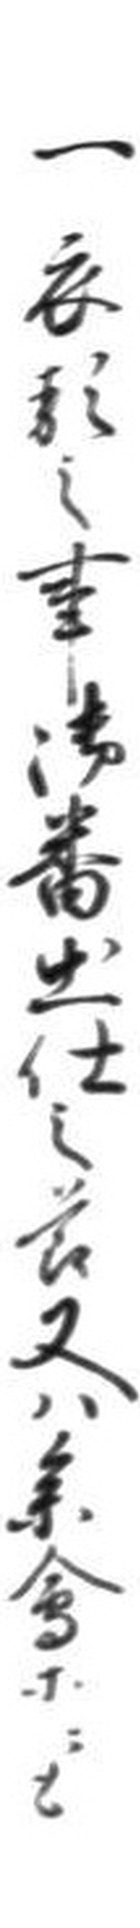一衣類之事御番出仕之節又は参会等にも
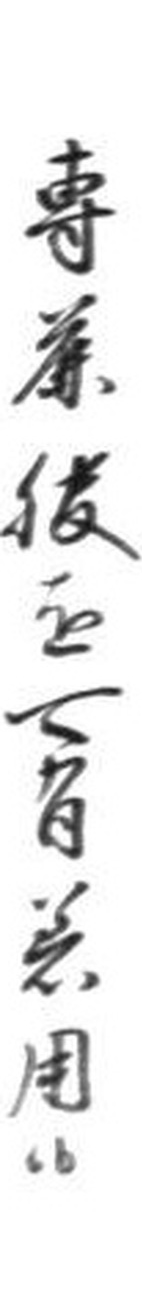専麁服を可有着用候

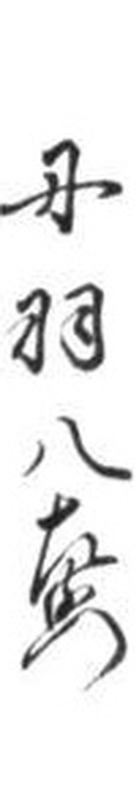丹羽八左衛門
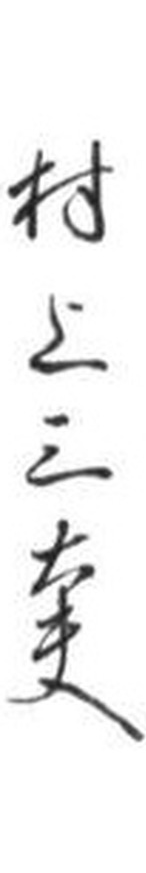村上三大夫
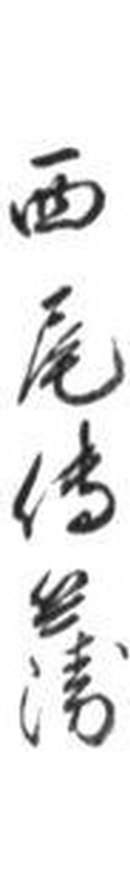西尾伝兵衛
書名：家譜 十六 吉品公 従貞享三年閏三月到同四年
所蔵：福井県文書館 Fukui Prefectural Archives
